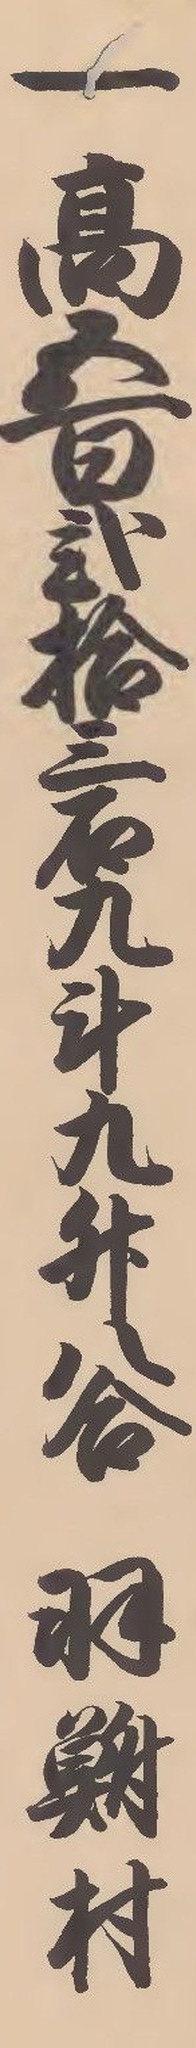一高五百弐拾三石九斗九升八合羽鮒村
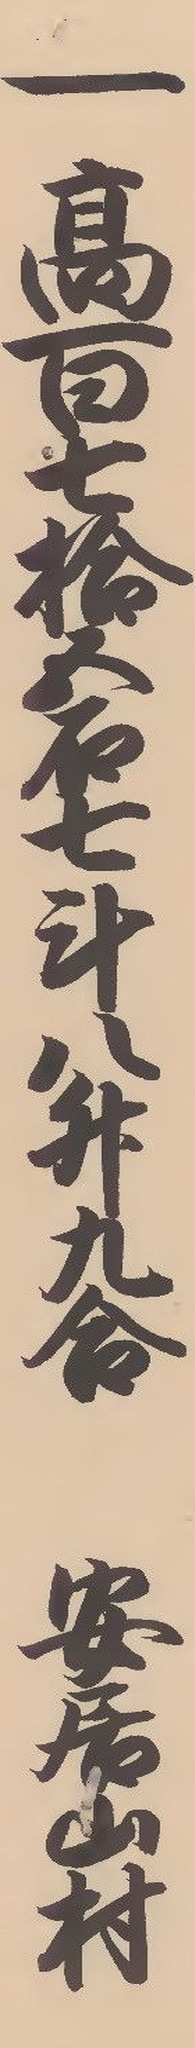一高百七拾五石七斗八升九合安居山村
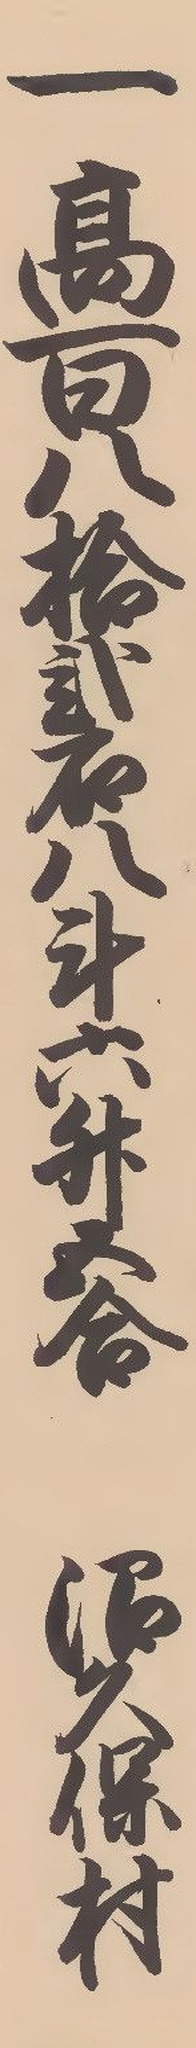一高百八拾弐石八斗六升五合沼久保村
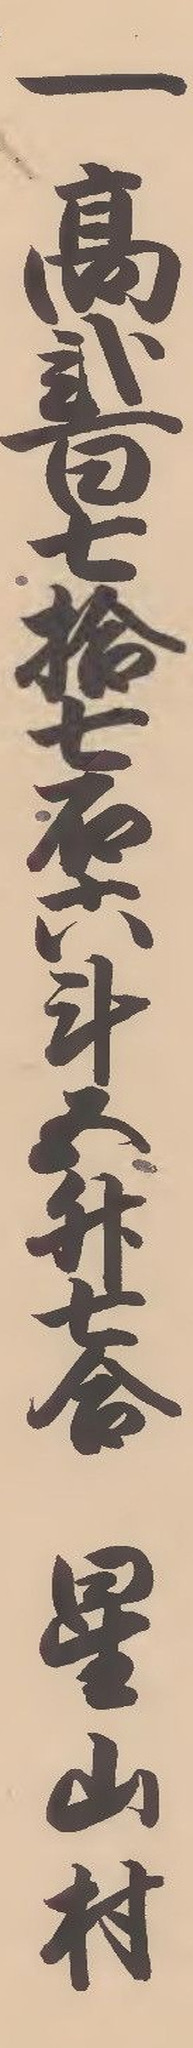一高弐百七拾七石六斗五升七合星山村

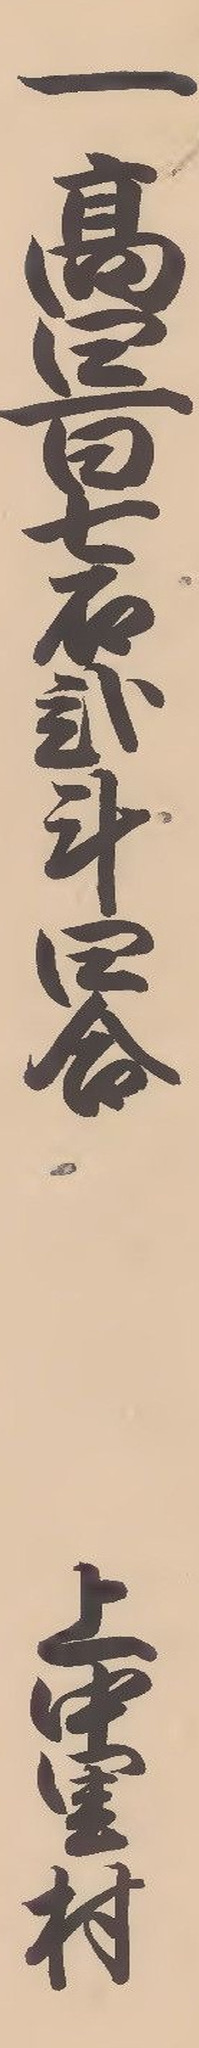一高四百七石弐斗四合上中里村
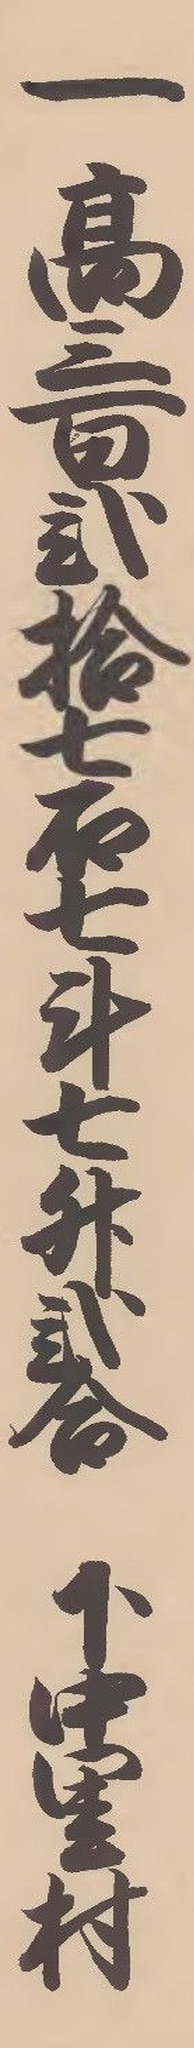一高三百弐拾七石七斗七升弐合下中里村
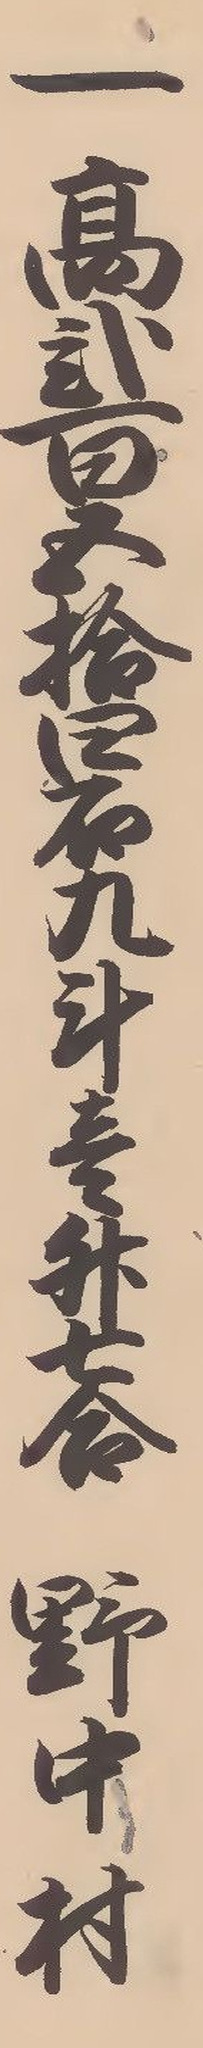一高弐百五拾四石九斗壱升七合野中村
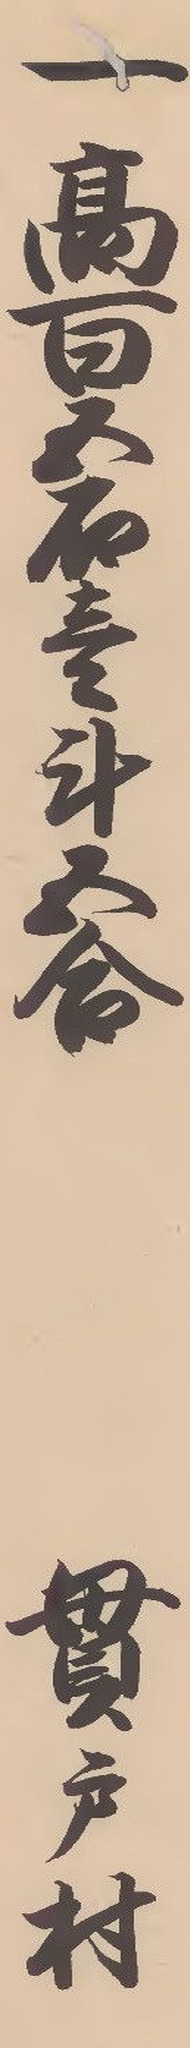一高百五石壱斗五合貫戸村
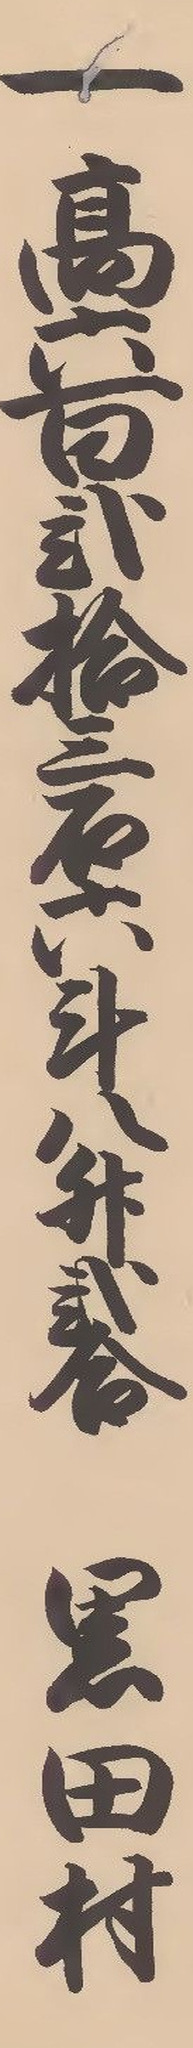一高六百弐拾三石六斗八升弐合黒田村
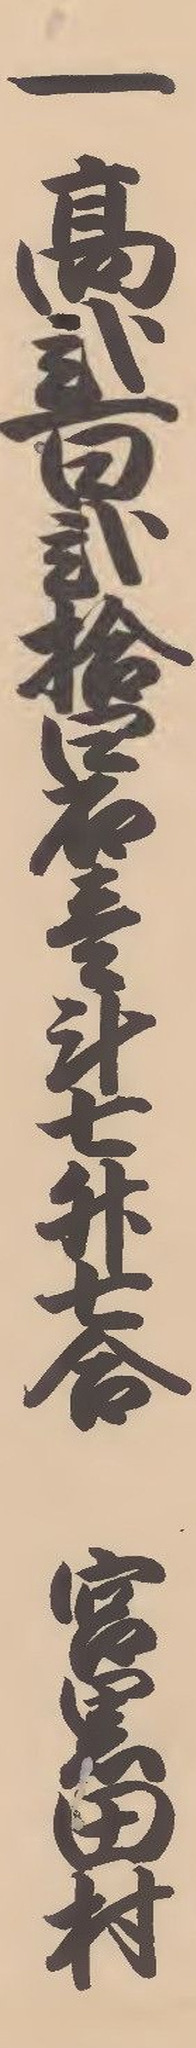一高弐百弐拾四石壱斗七升七合宮黒田村

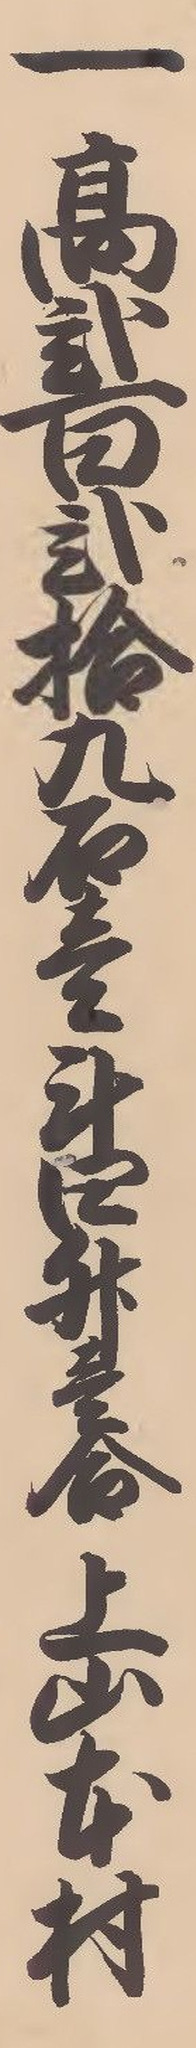一高弐百弐拾九石壱斗四升壱合上山本村
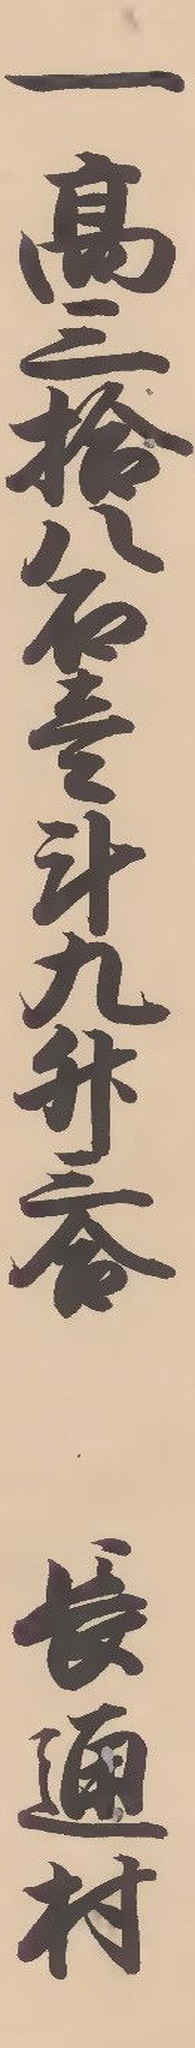一高三拾八石壱斗九升三合長通村
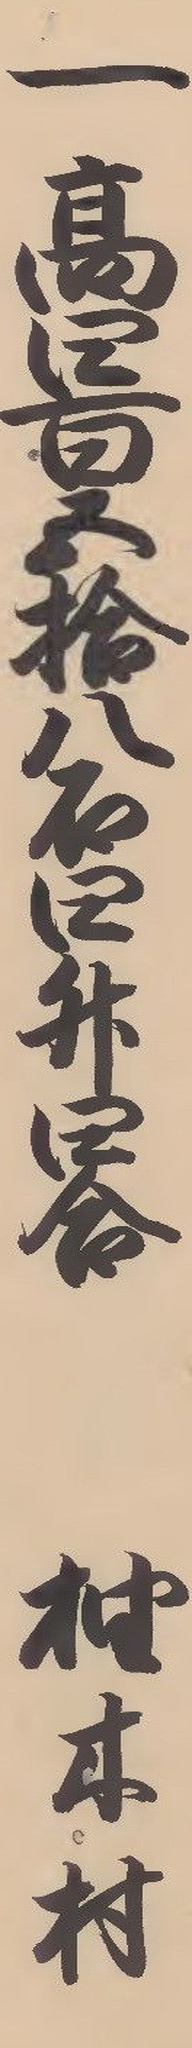一高四百五拾八石四升四合柚木村

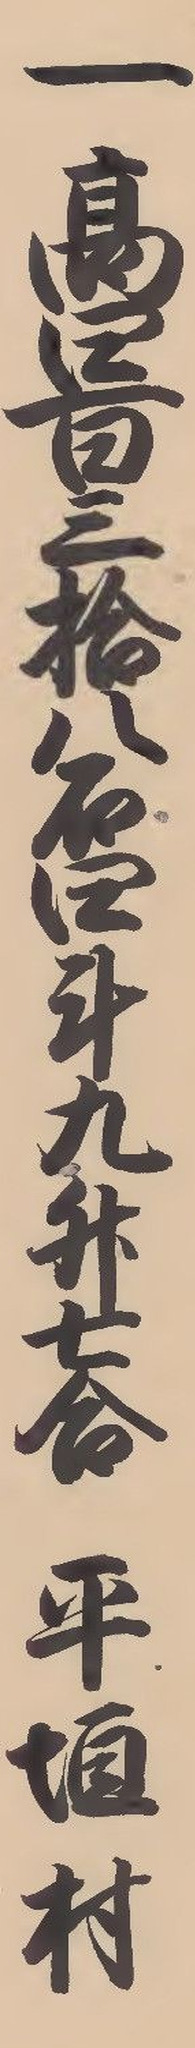一高四百三拾八石四斗九升七合平垣村
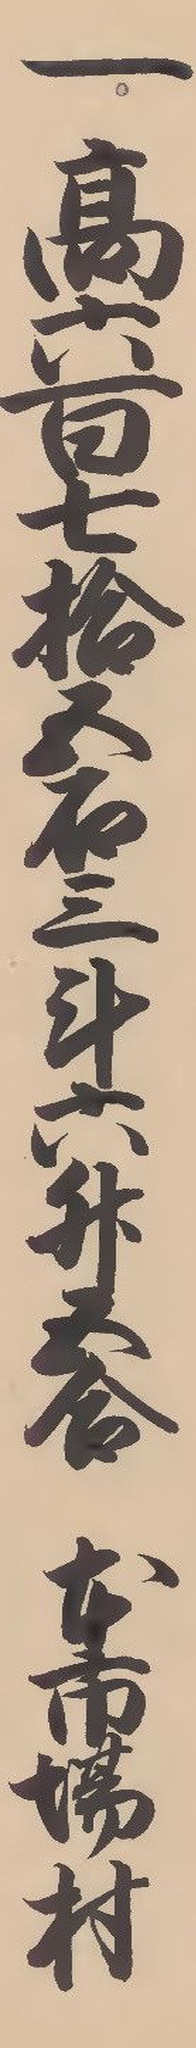一高六百七拾五石三斗六升五合本市場村
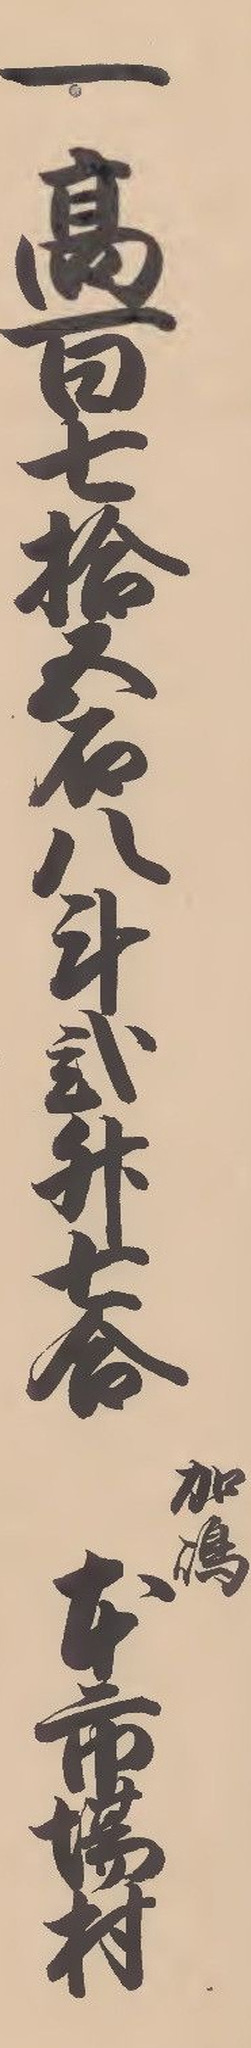一高六百七拾五石三斗六升五合本市場村
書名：駿河国郷帳
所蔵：国立公文書館 National Archives of Japan
